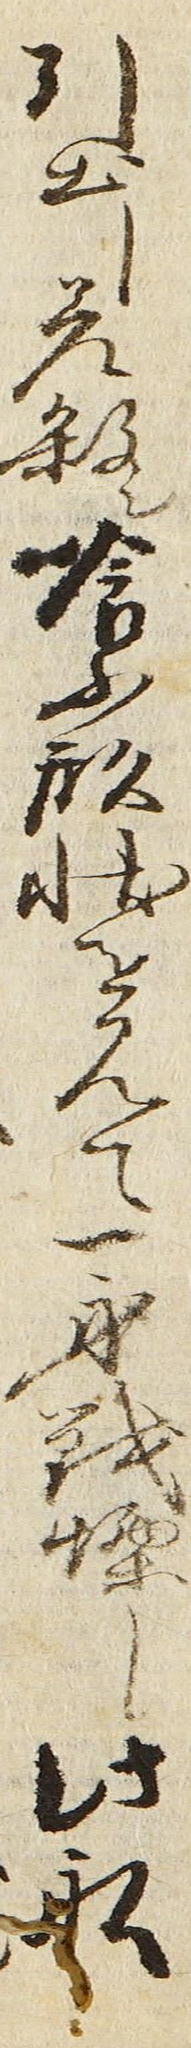引出し差殺シ喰ふ形状を見て一身戦慄し此船
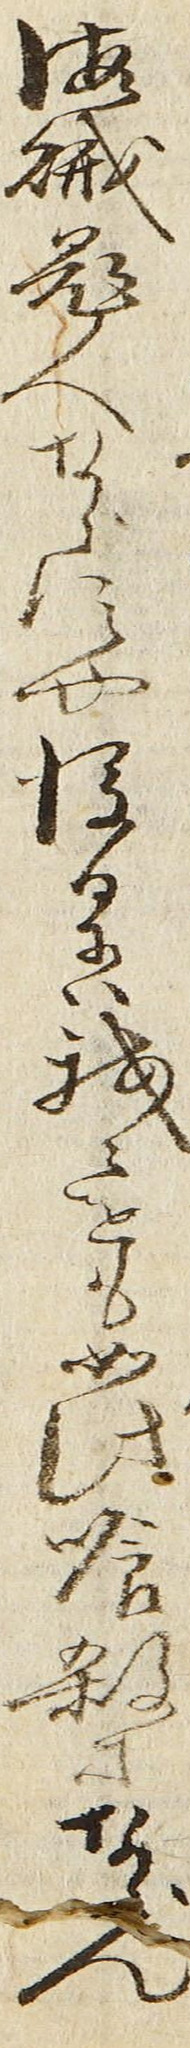海賊罪人ならすや後日にハ我々をも如此喰殺すならん
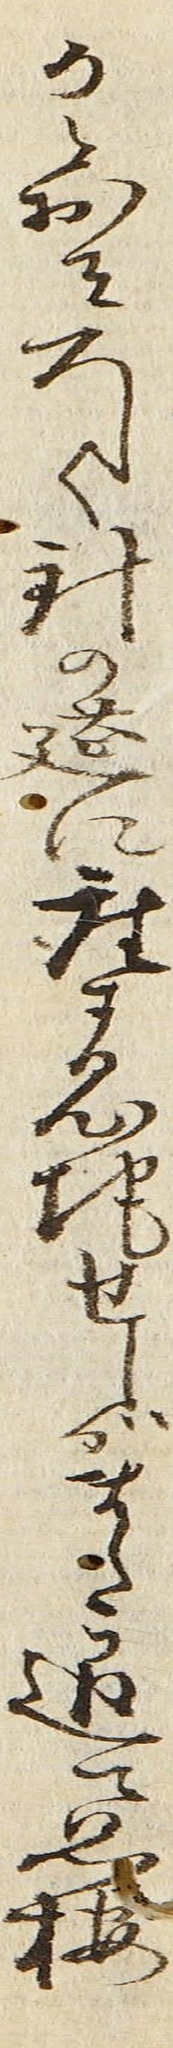かとおそろしく針の莚に座する心地せしがまた過て思按
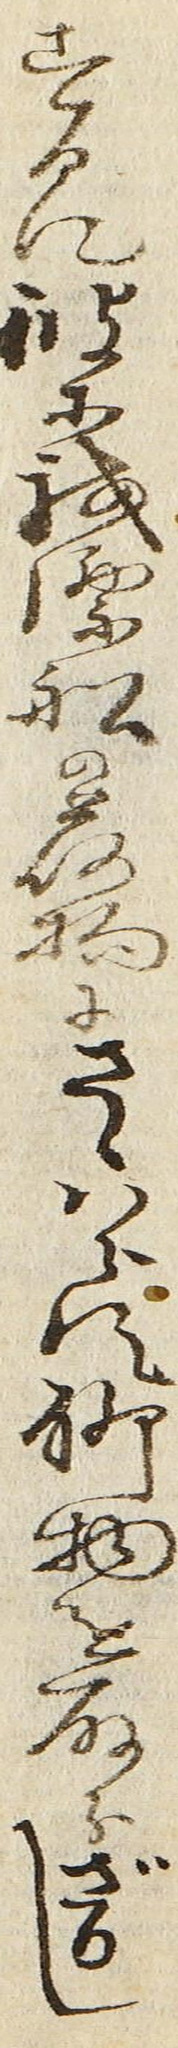するに彼等我漂船の荷物にさゝハらす聊物を取らざりし
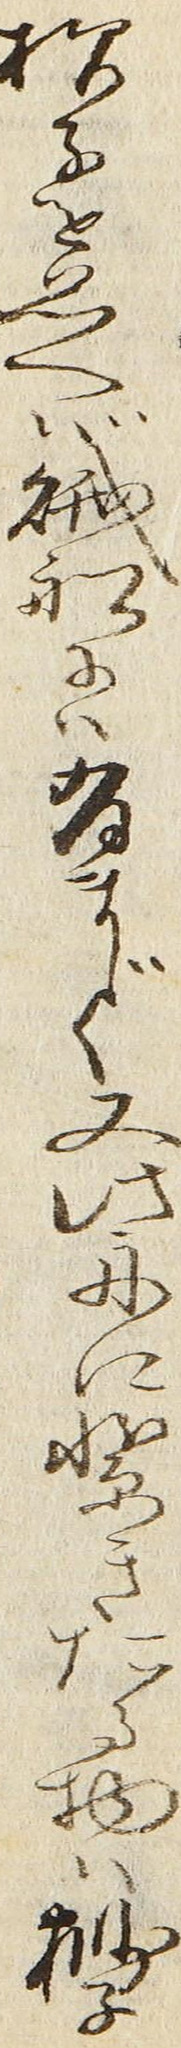様子を思へバ賊船にハ有まじく又此舟に繋きたる物ハ獅子
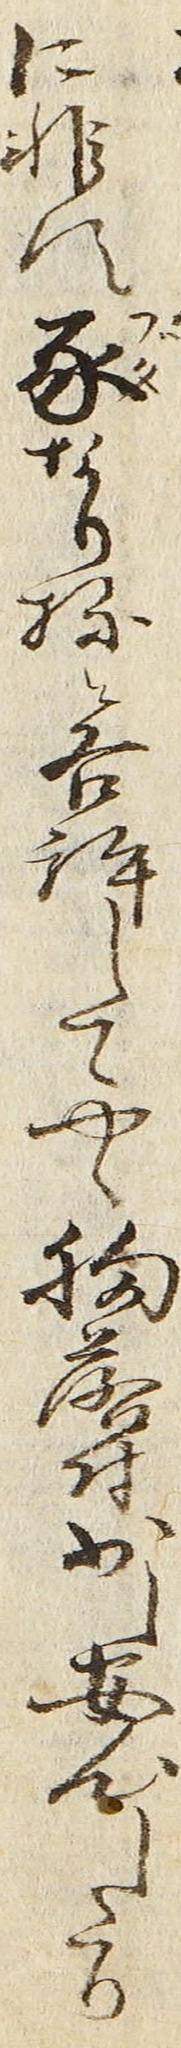に非す豕なり抔と各許してやゝ胸落付少し安心したり
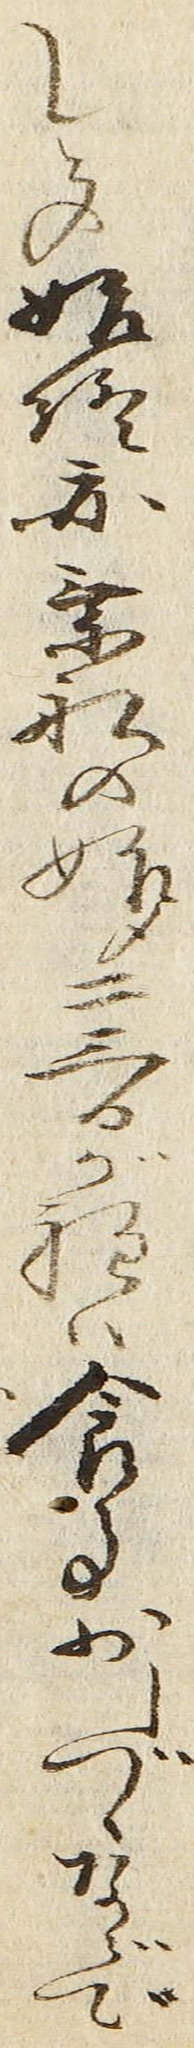しとの始終亦乗船の始メ二三日が程ハ食事少しづゝならで
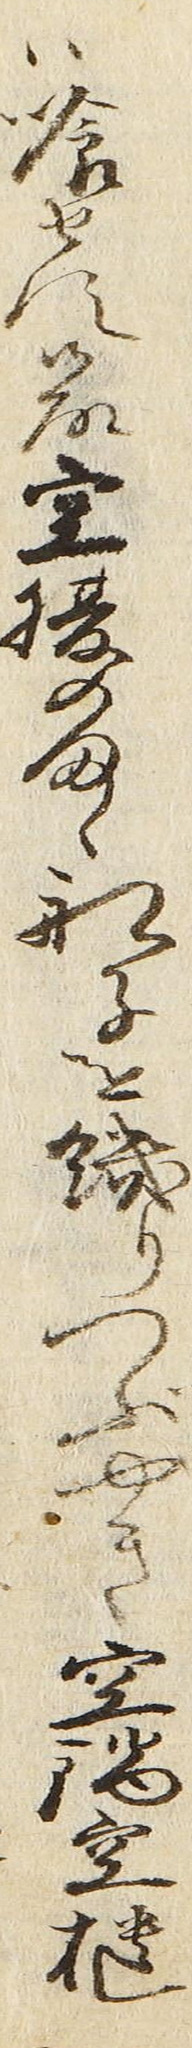ハ喰セす候故空腹のまゝ船子をりつぶやき空鍋空櫃
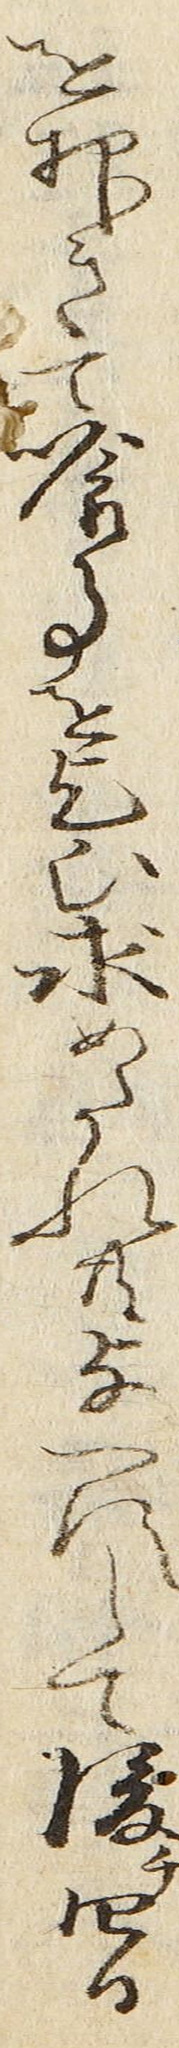を叩きて喰事を乞ひ求めたれ共与へすして後チ四日
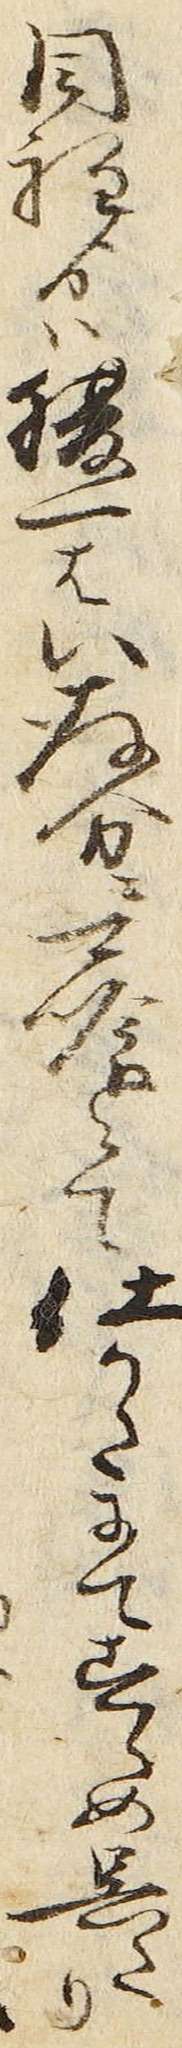目程ゟハ腹一はい存分ニ可喰ニて仕かたにてすゝめ呉たり
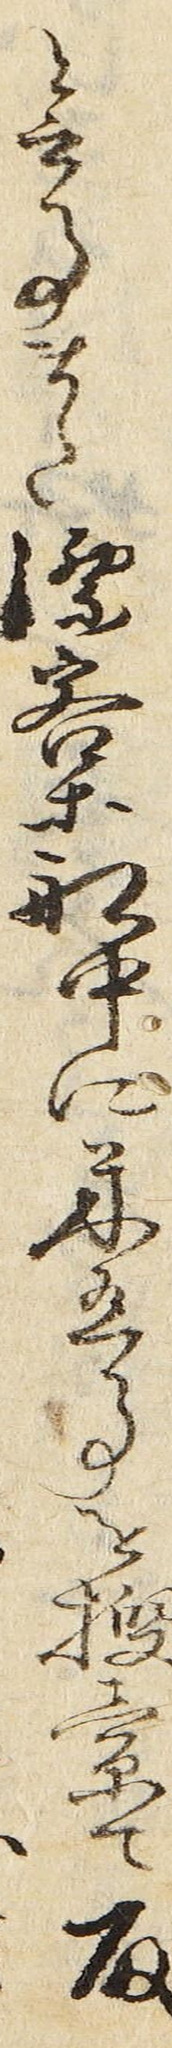と云事また漂客等船中に米有事を捜索て取
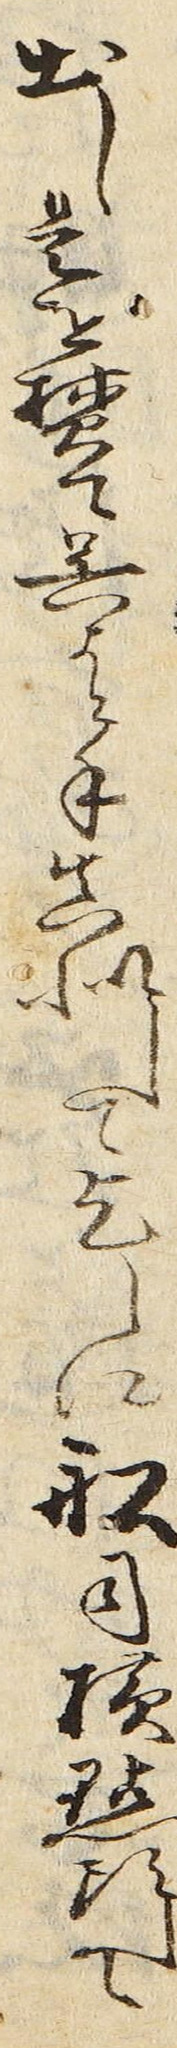出し是を焚て呉よと手真似して乞しに船司横点頭して
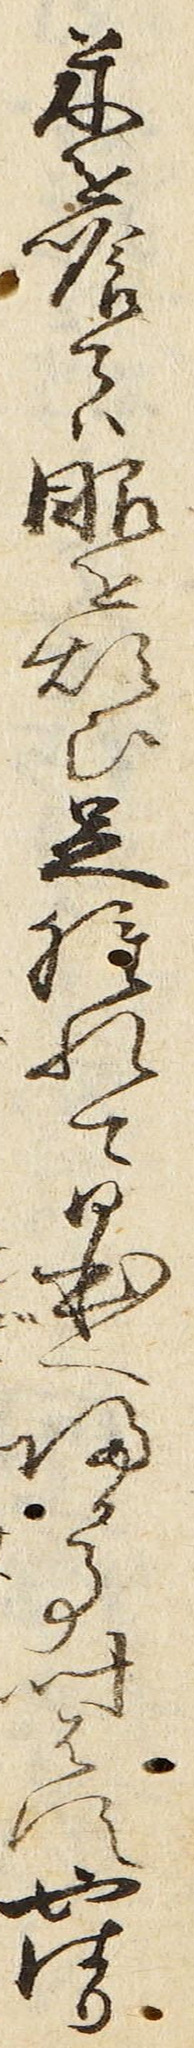米を喰てハ眼を煩ひ足腫れて日本へ帰る事叶はすやはり
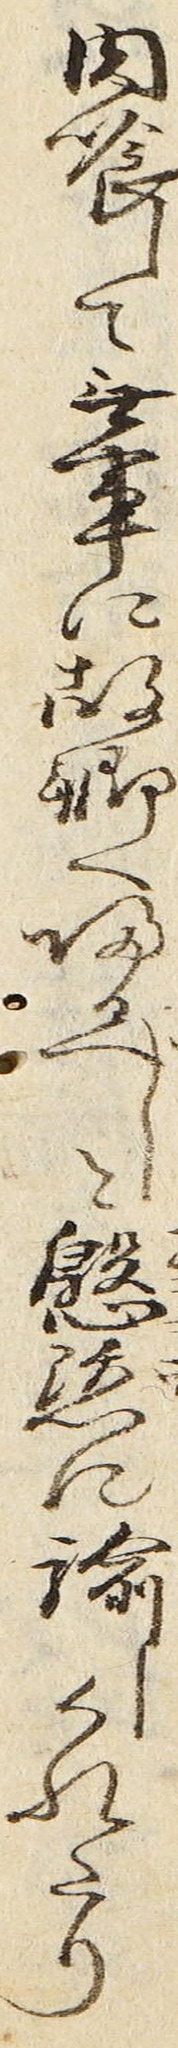肉喰して無事に故郷へ帰るべしと慇懃に諭しくれたり
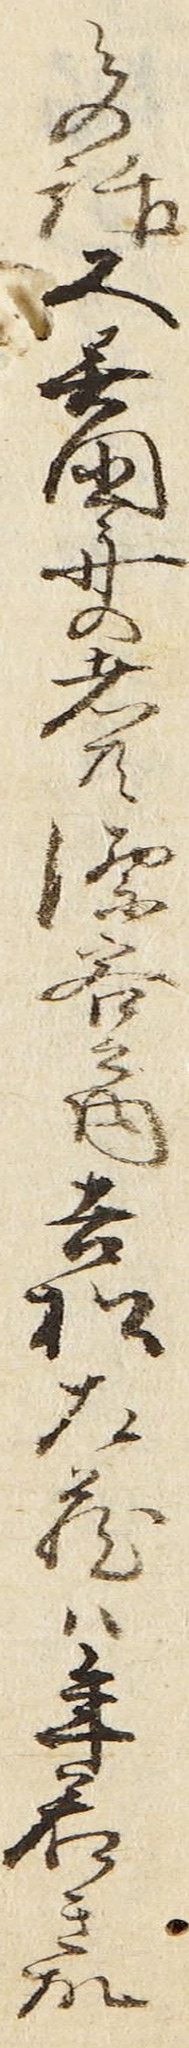との話又異国舟の者共漂客之内吉松左蔵ハ年若き故
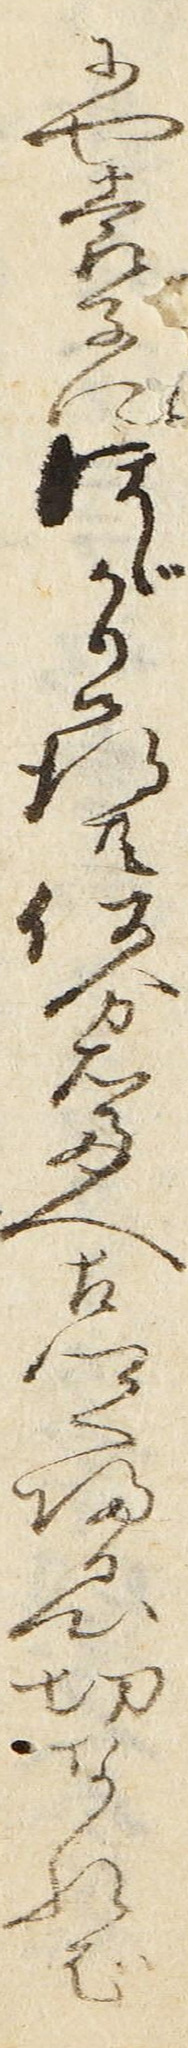にや養子にほしがり候得共何分右両人古郷へ帰る心切なれば
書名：亜墨利加漂流記聞
